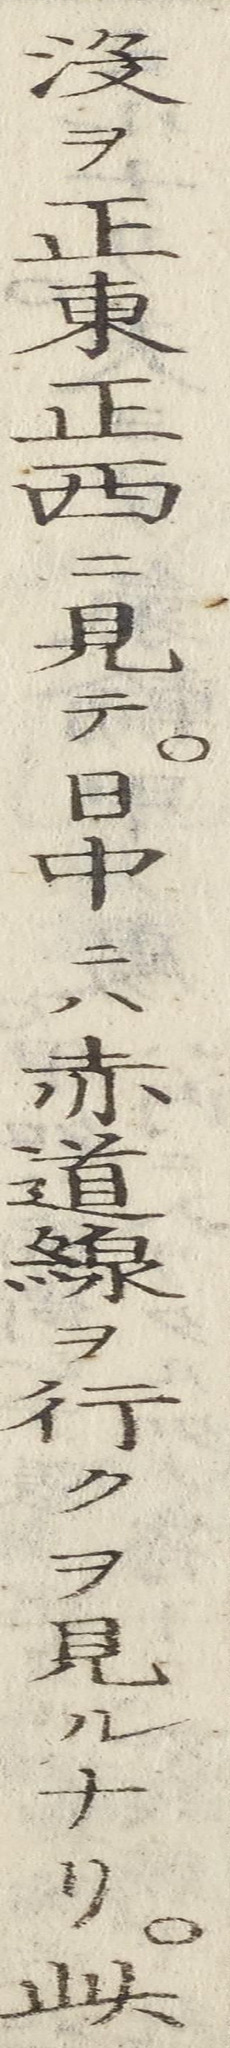没ヲ正東正西ニ見テ。日中ニハ赤道線ヲ行クヲ見ルナリ。此
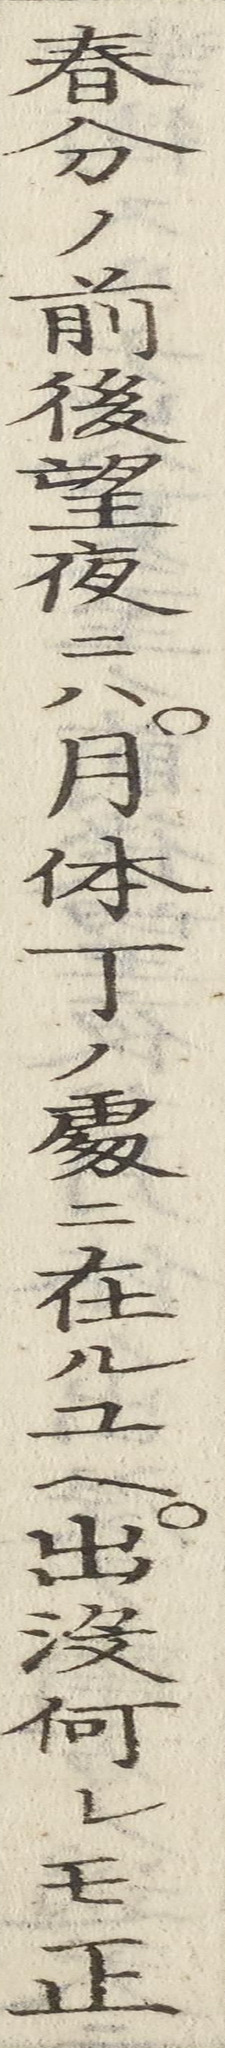春分ノ前後望夜ニハ。月体丁ノ処ニ在ルユヘ。出没何レモ正
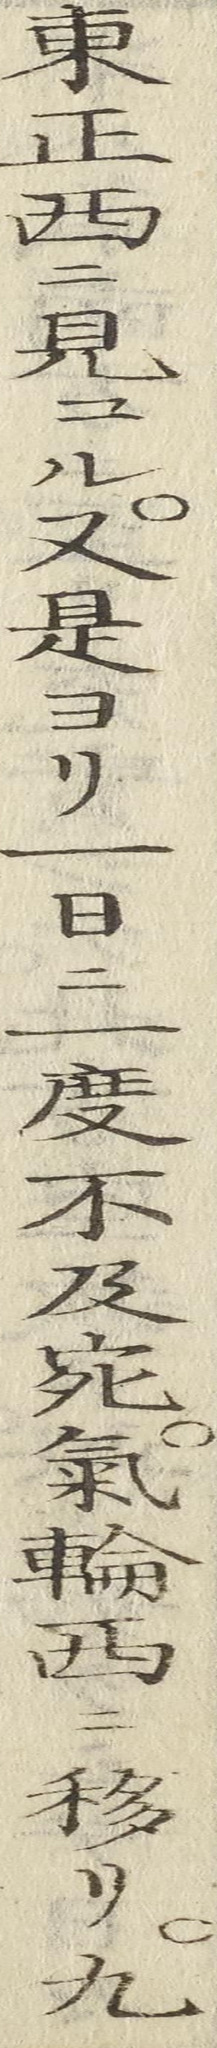東正西ニ見ユル。又是ヨリ一日ニ一度不及宛。気輪西ニ移リ。九
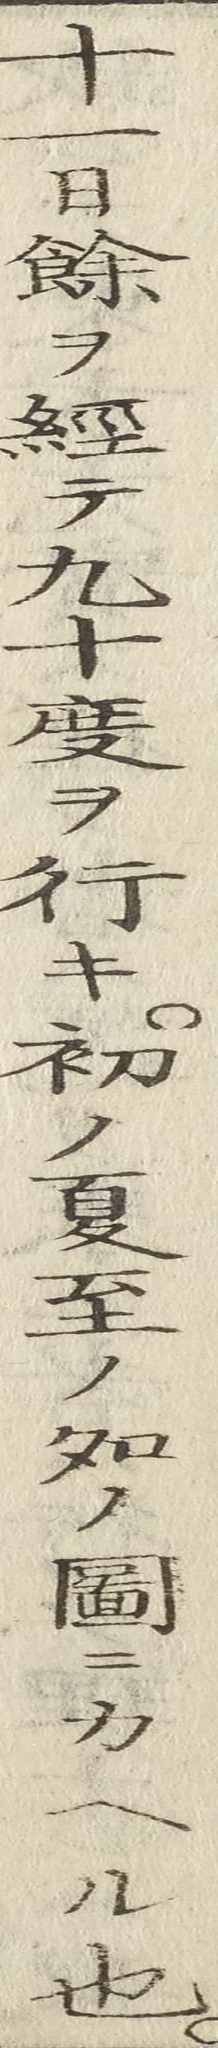十一日余ヲ経テ九十度ヲ行キ。初ノ夏至ノ処ノ図ニカヘル也。
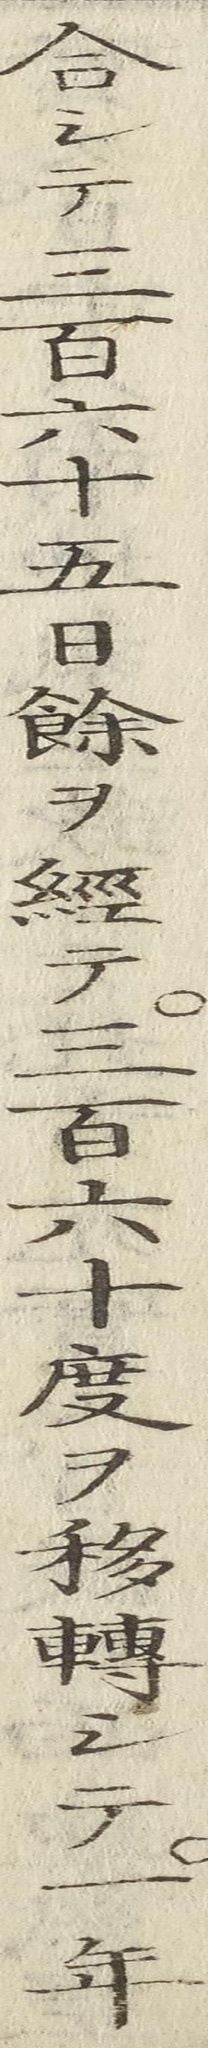合シテ三百六十五日余ヲ経テ。三百六十度ヲ移転シテ。一年
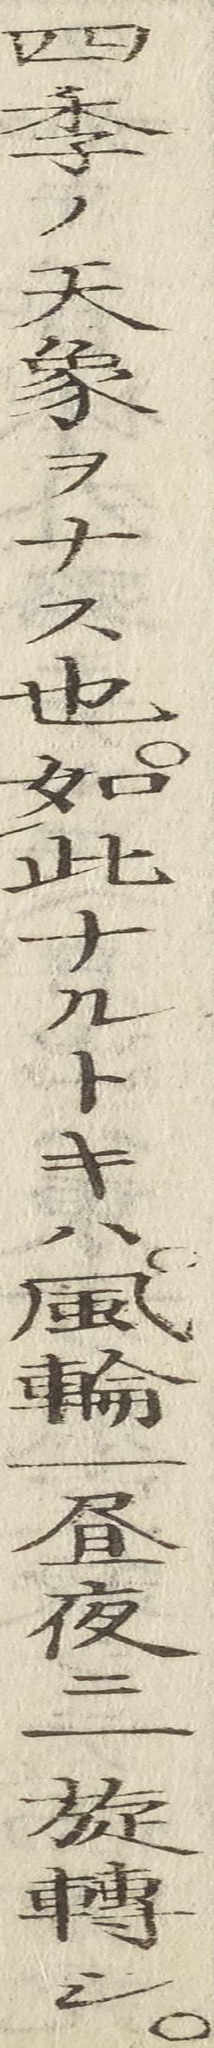四季ノ天象ヲナス也。如此ナルトキハ。風輪一昼夜ニ一旋転シ。
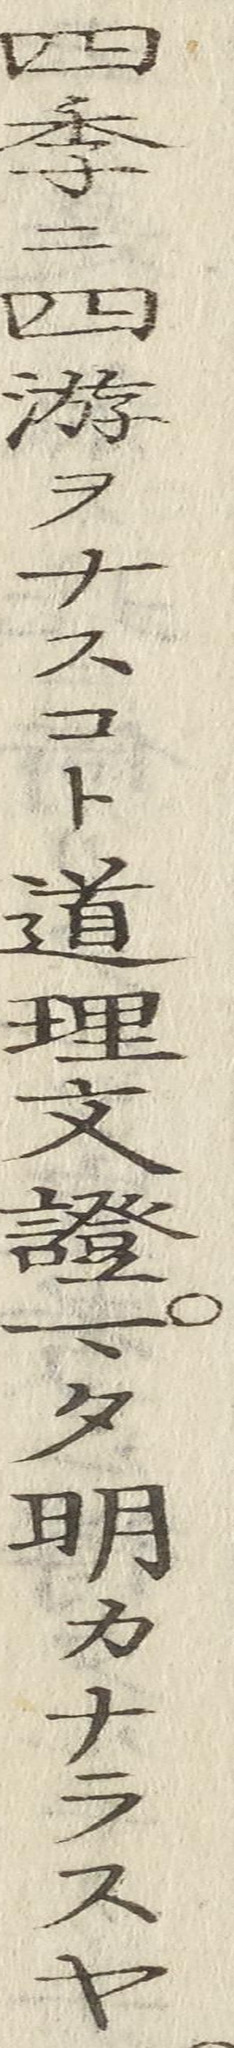四季ニ四游ヲナスコト道理文証。マタ明カナラスヤ。
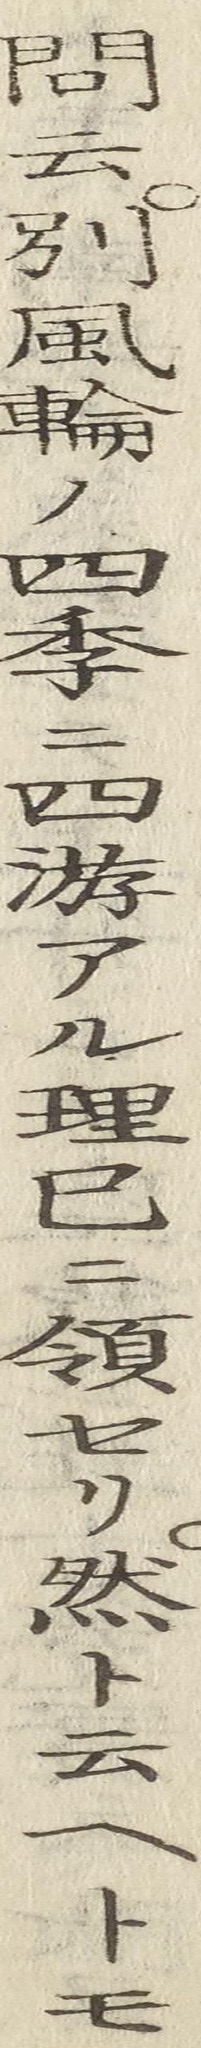問云。別風輪ノ四季ニ四游アル理已ニ領セリ。然ト云ヘトモ
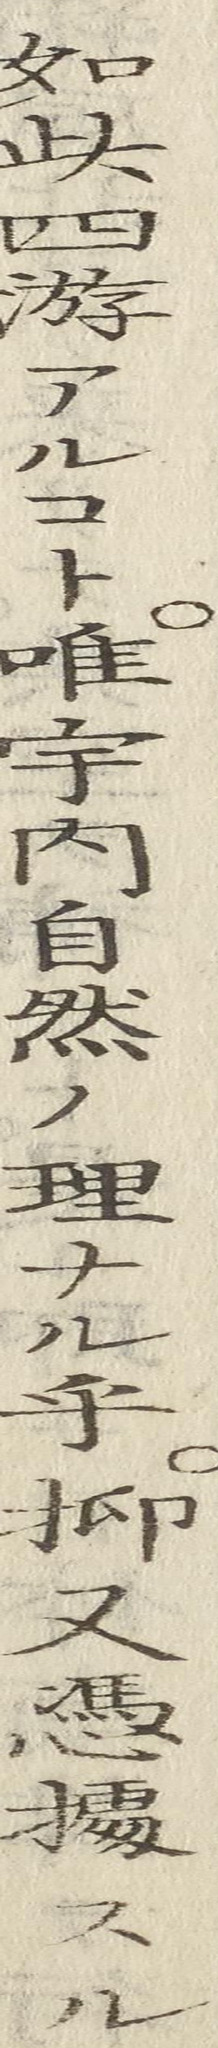如此四游アルコト。唯宇内自然ノ理ナル乎。抑又憑拠スル
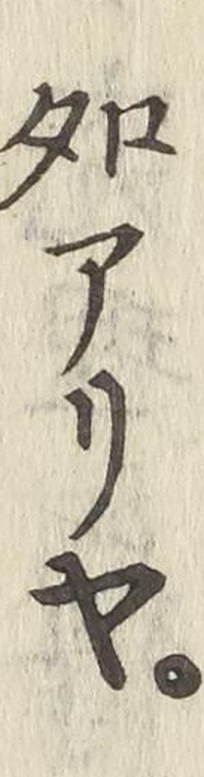処アリヤ。
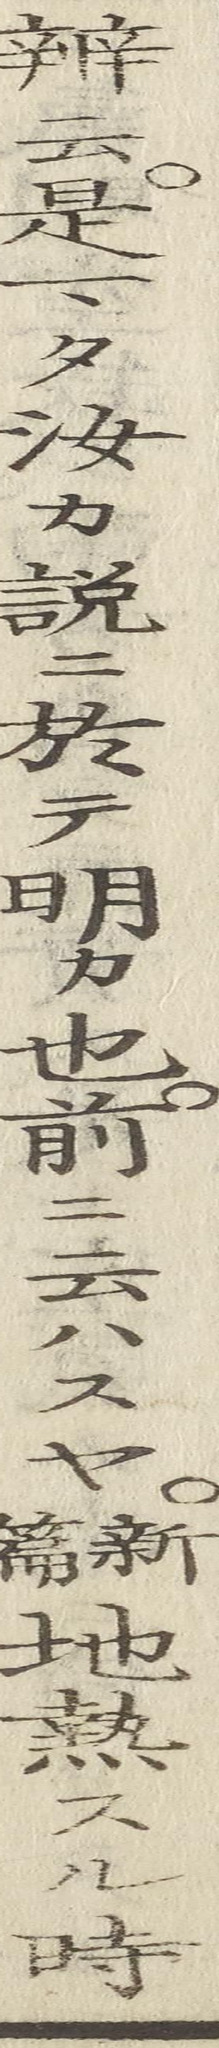弁云。是マタ汝カ説ニ於テ明カ也。前ニ云ハスヤ。新篇地熱スル時
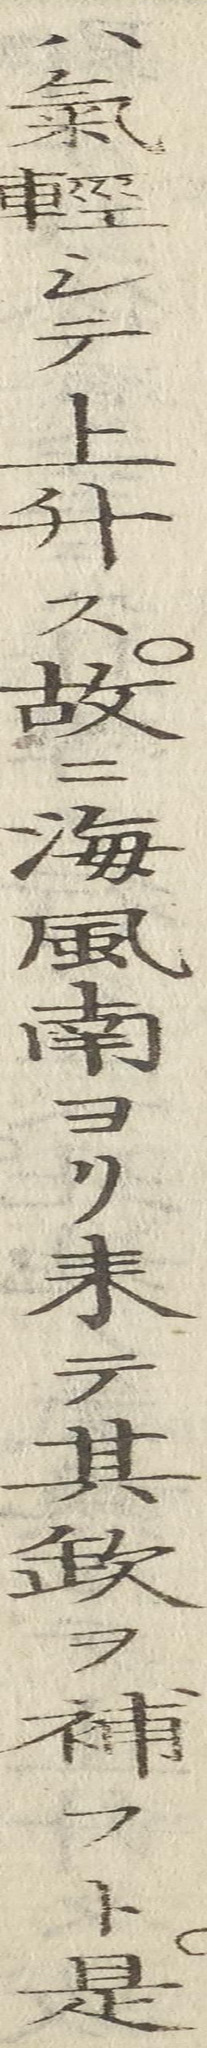ハ気軽シテ上升ス。故ニ海風南ヨリ来テ其欫ヲ補フト。是

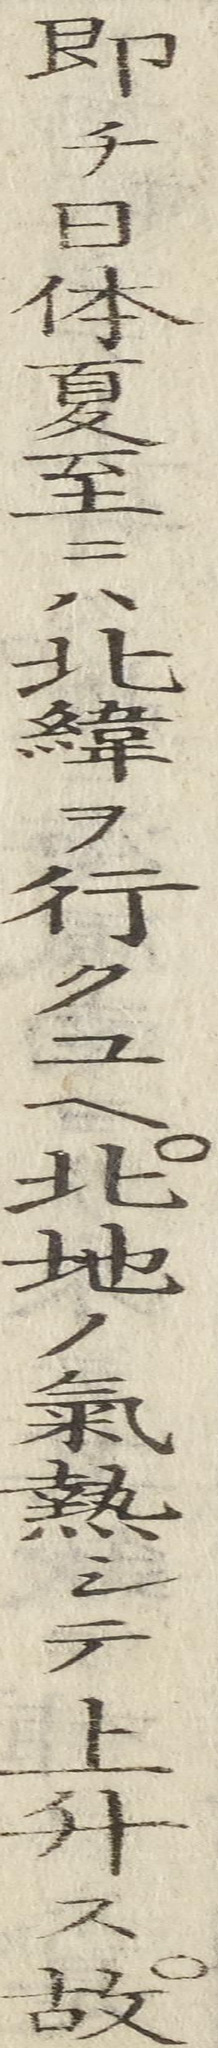即チ日体夏至ニハ北緯ヲ行クユヘ。北地ノ気熱シテ上升ス。故
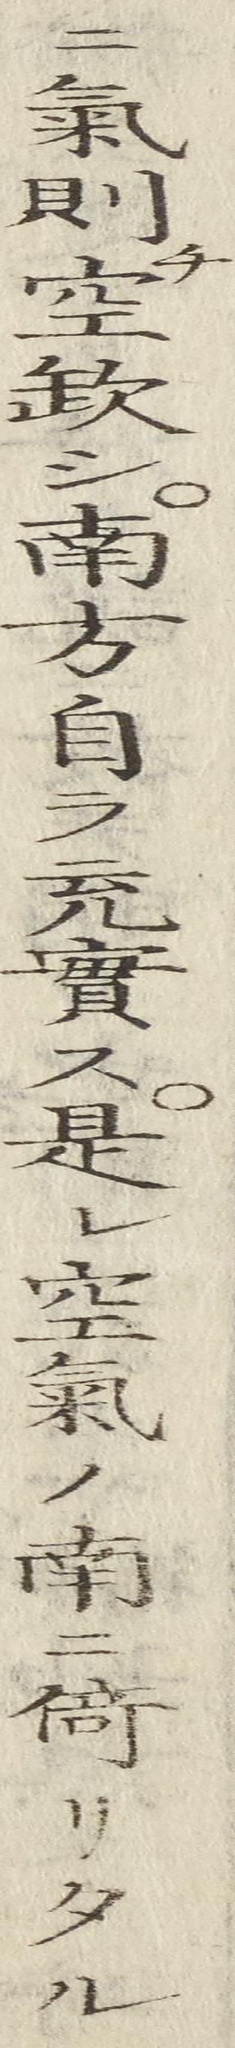ニ気則空欫シ。南方自ラ充実ス。是レ空気ノ南ニ倚リタル
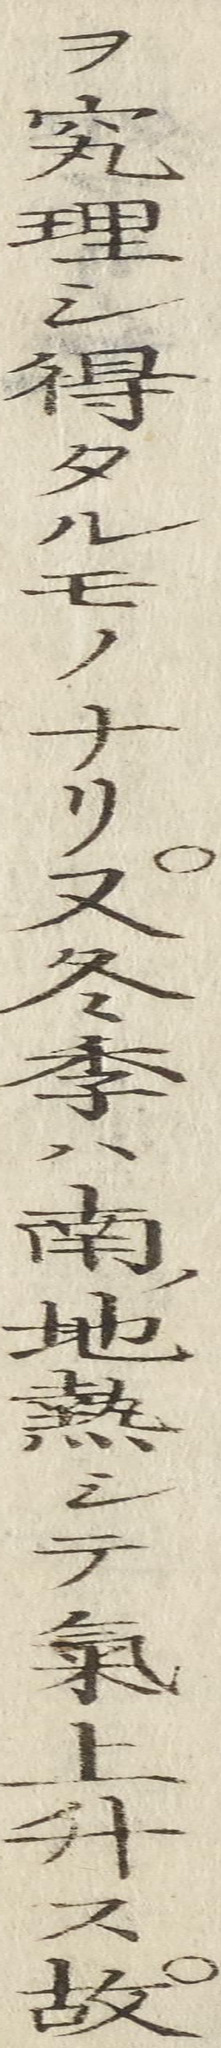ヲ究理シ得タルモノナリ。又冬季ハ南地熱シテ気上升ス。故
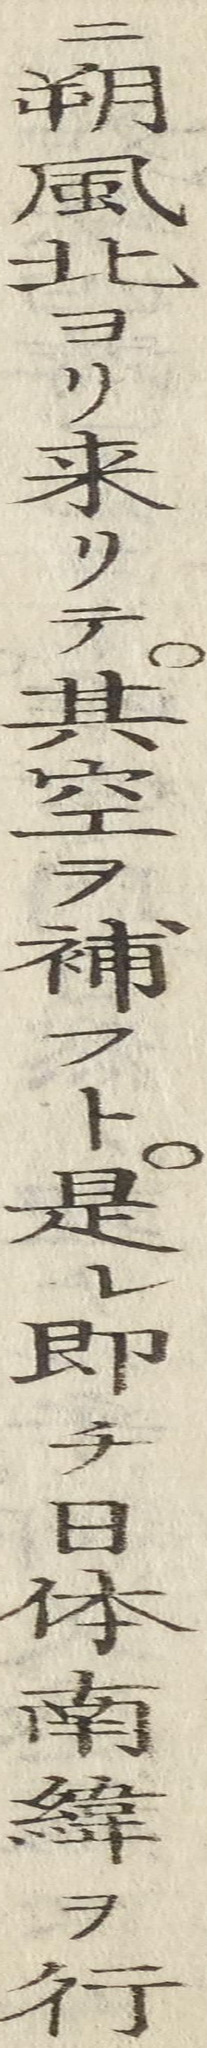ニ朔風北ヨリ来リテ。其空ヲ補フト。是レ即チ日体南緯ヲ行
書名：護法新論　二編　上
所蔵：東京大学地震研究所図書室 Earthquake Research Institute Library, The University of Tokyo, JAPAN
